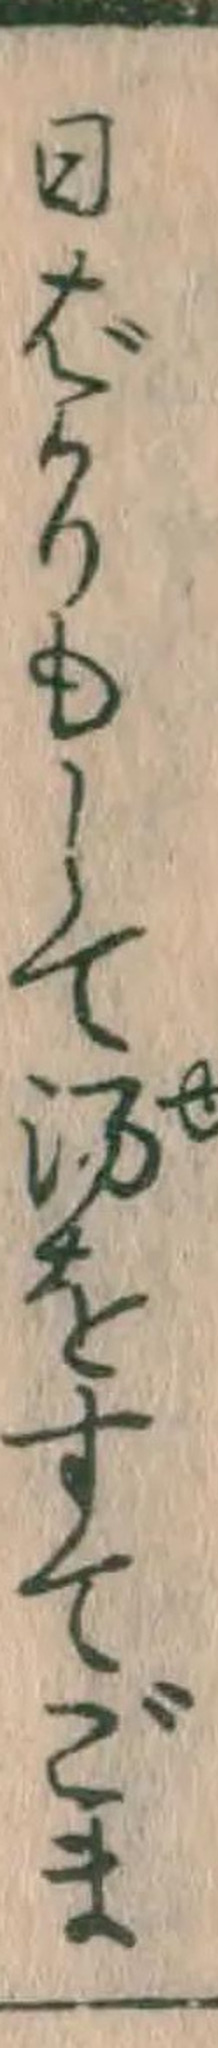日ばかりもして湯をすてごま
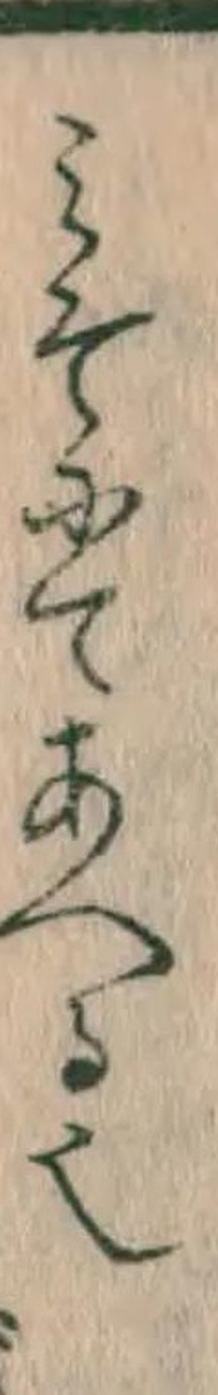みそにてあへる也
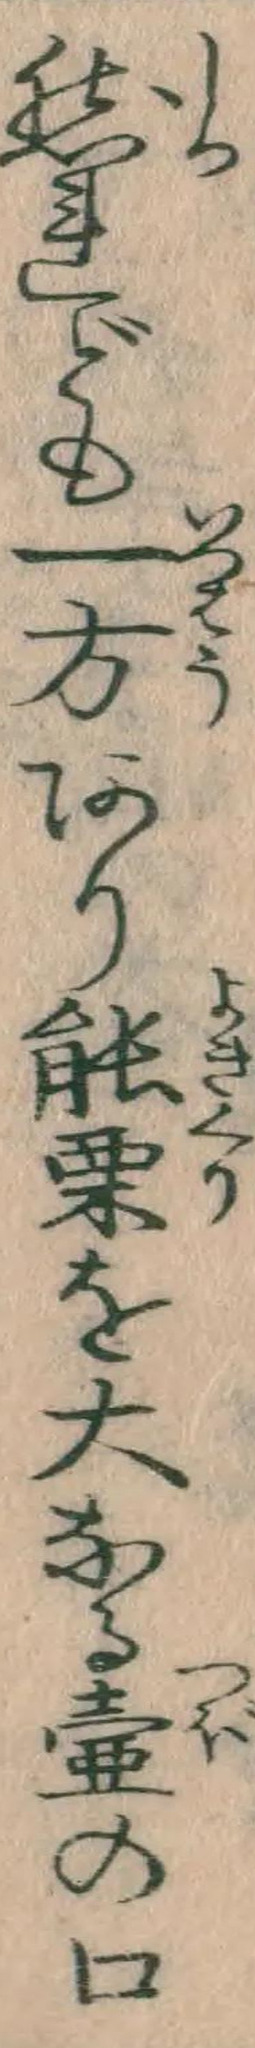然れども一方あり能栗を大なる壺の口
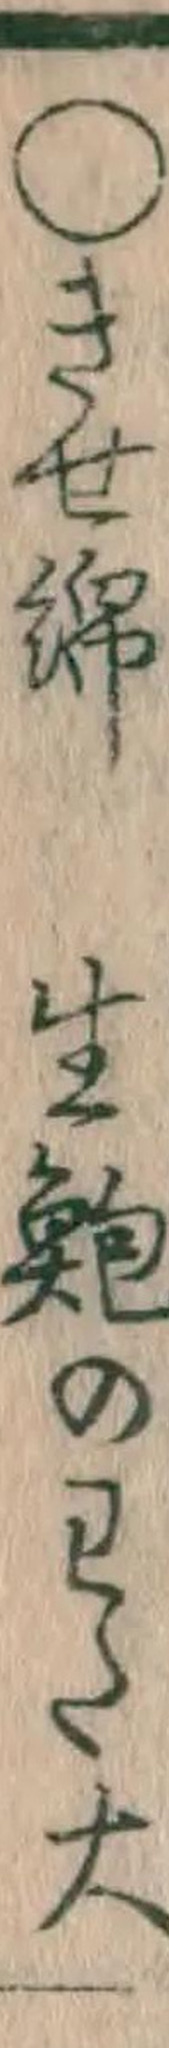○きせ綿生鮑のわた大
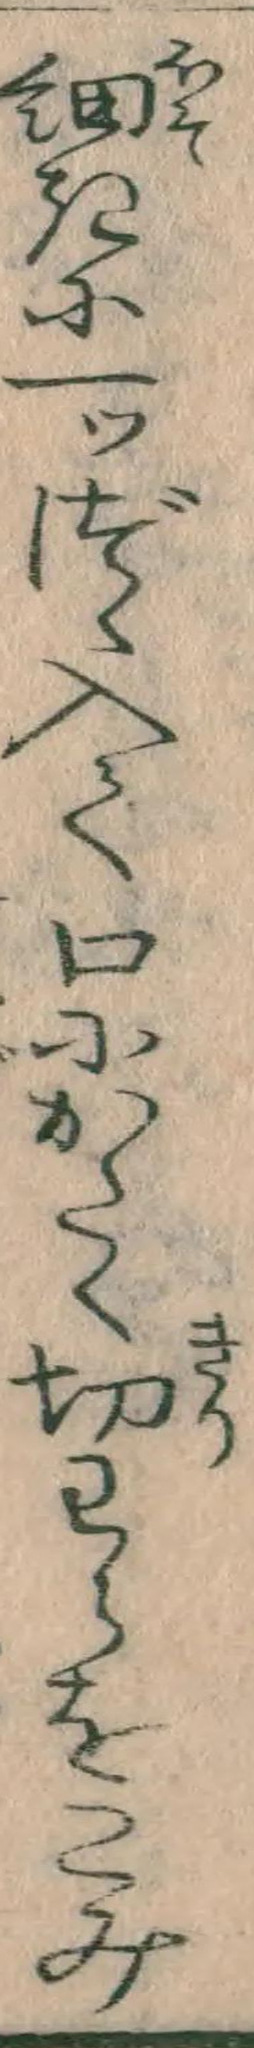細きに一ッづゝ入て口にかたく切わらをこみ
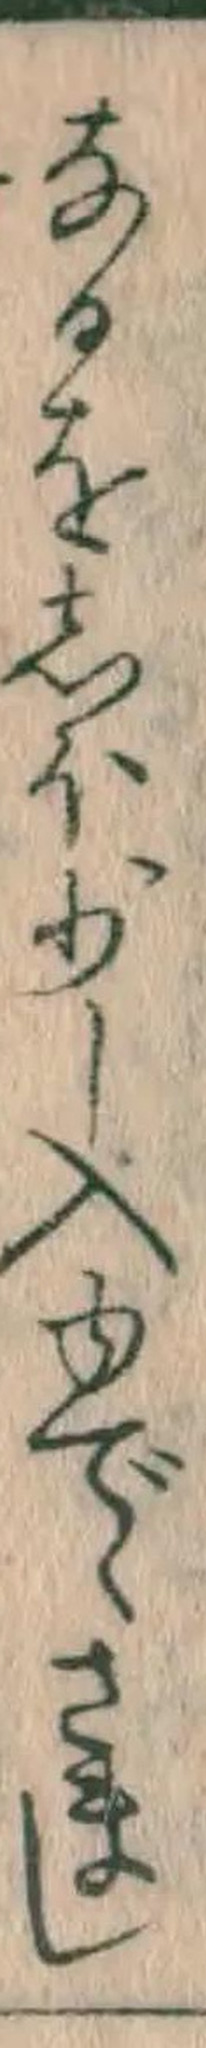なるをしほ少し入ゆでゝさまし
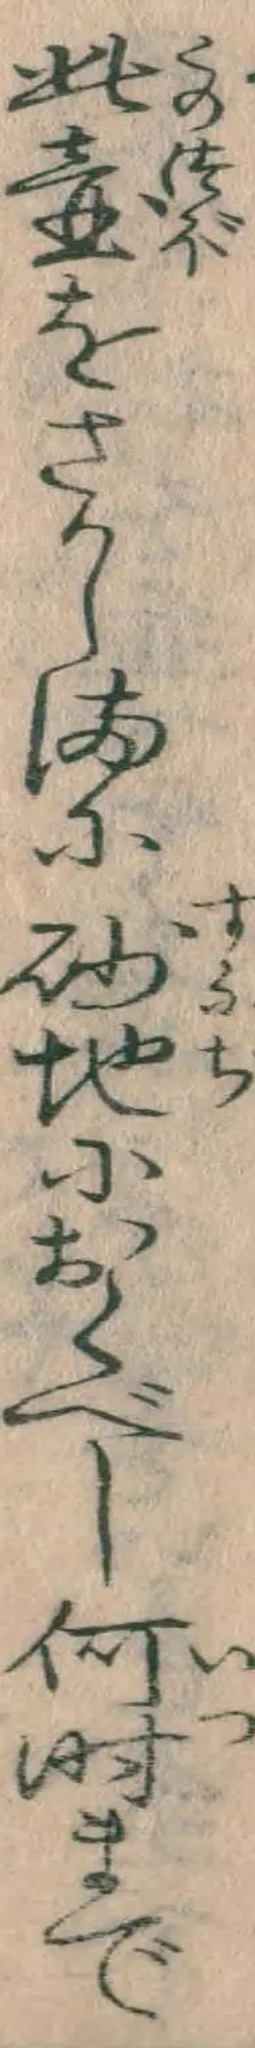此壺をさかしまに砂地におくべし何時まで
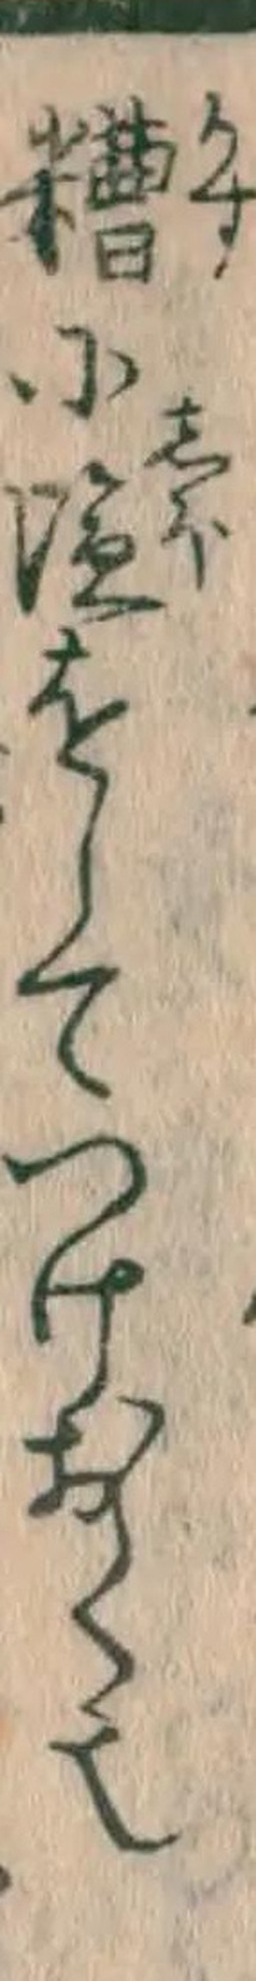糟に塩をしてつけおく也
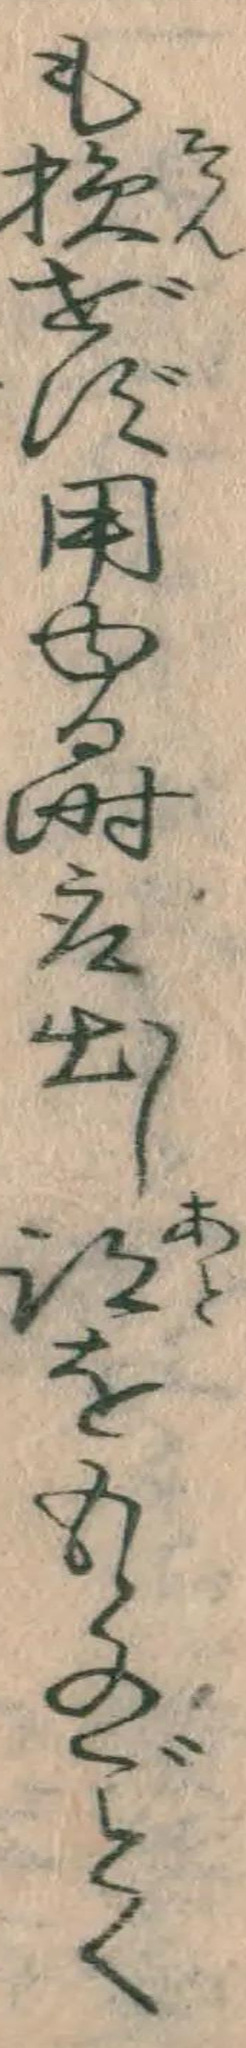も損ぜず用ゆる時取出し跡をもとのごとく
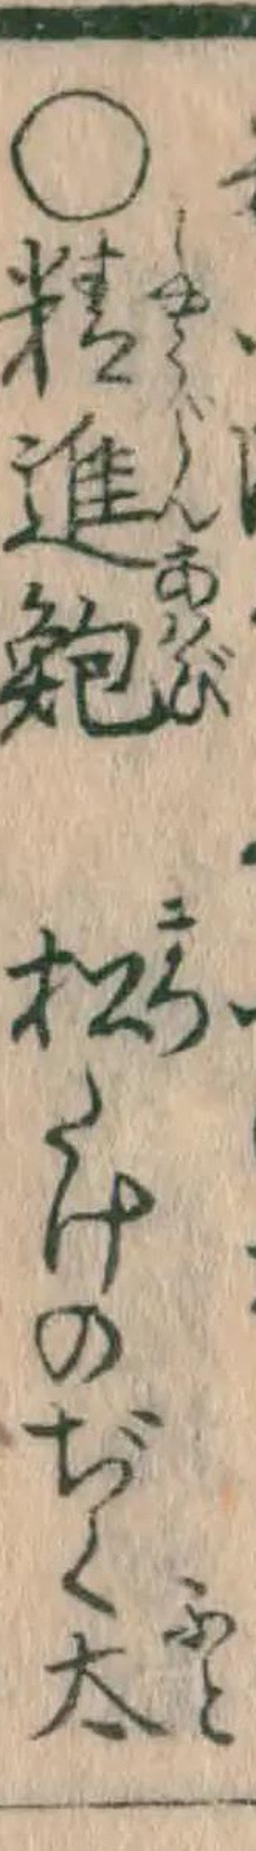○精進鮑松たけのぢく太
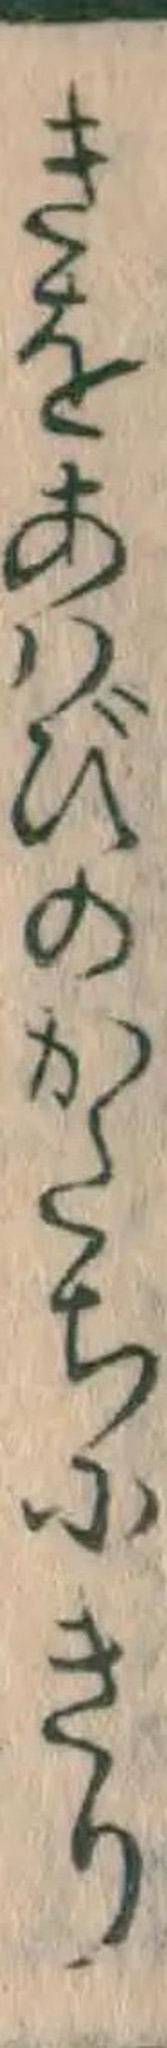きをあはびのかたちにきり
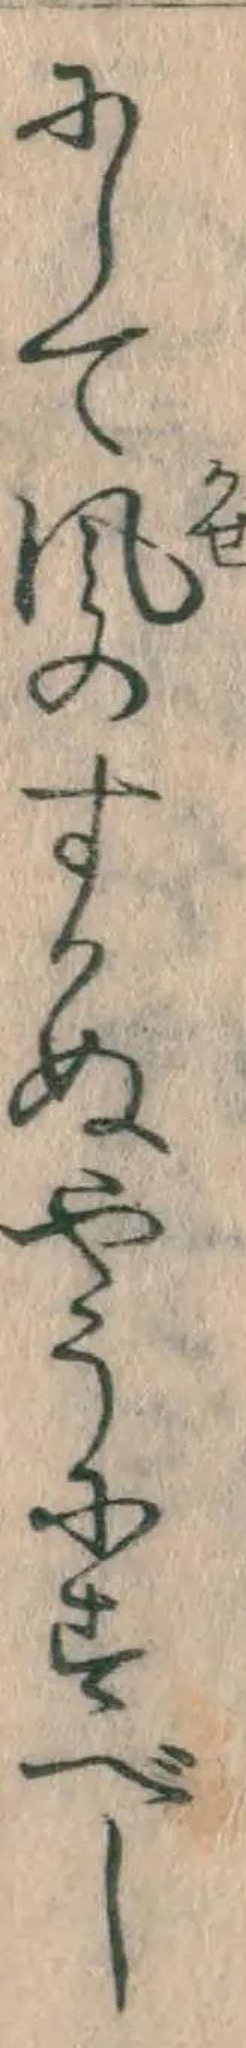にして風のすかぬやうにすべし
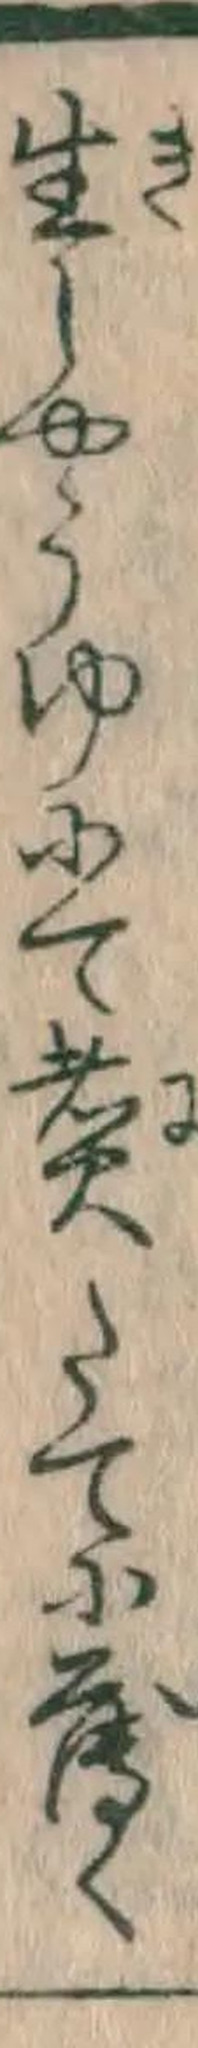生しやうゆにて煮たてに薄く
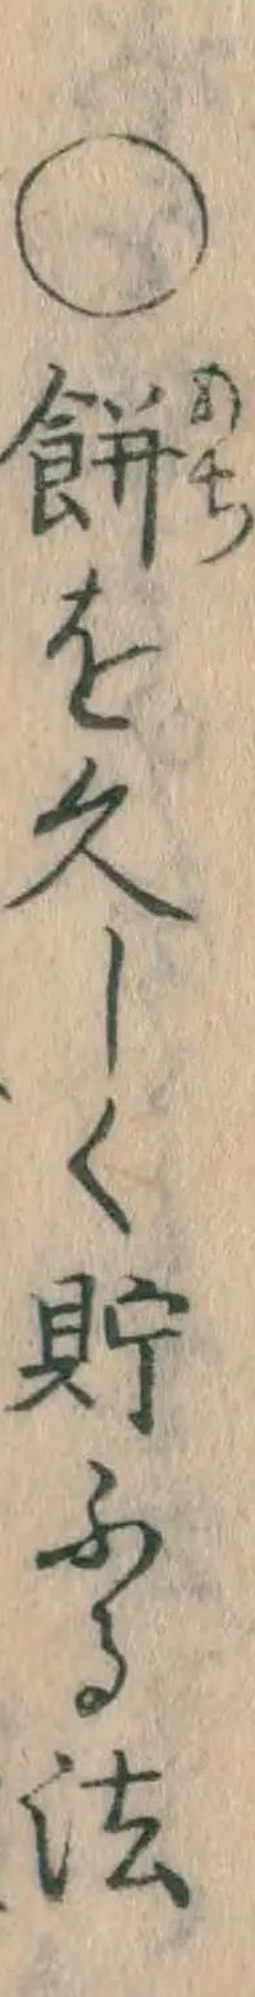○餅を久しく貯ふる法
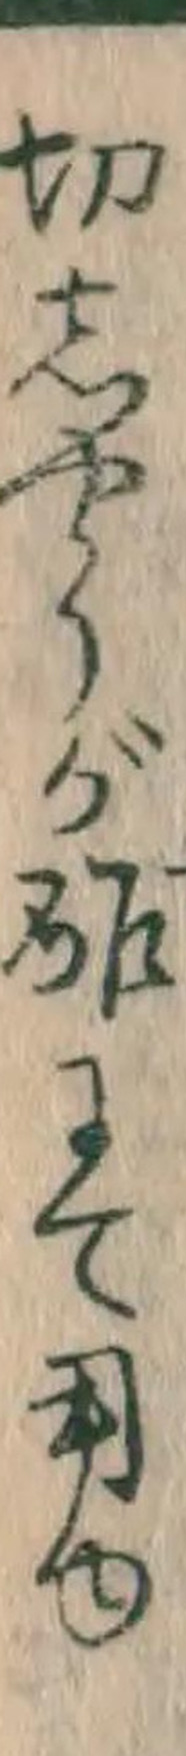切しやうが酢にて用ゆ
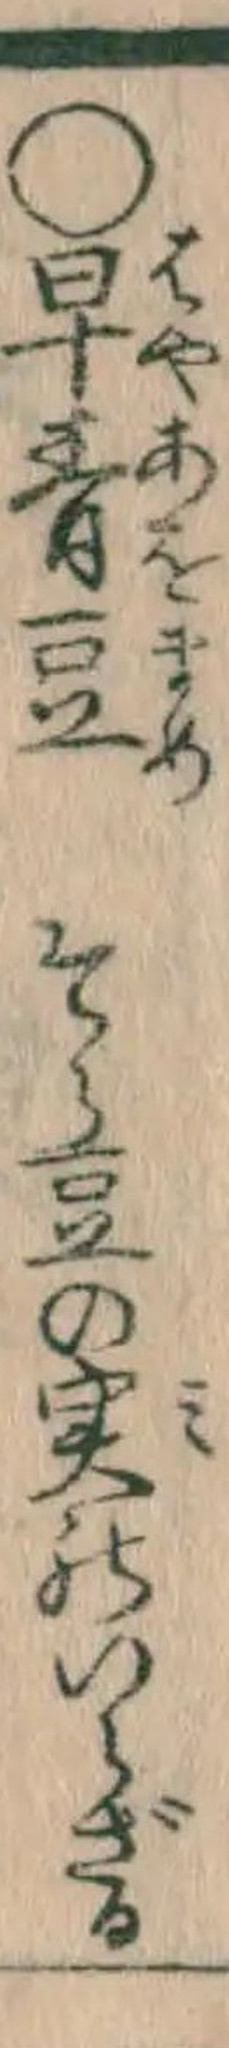○早青豆そら豆の実のいらざる
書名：広益秘事大全 3巻. [5]
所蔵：国立国会図書館 National Diet Library, JAPAN
